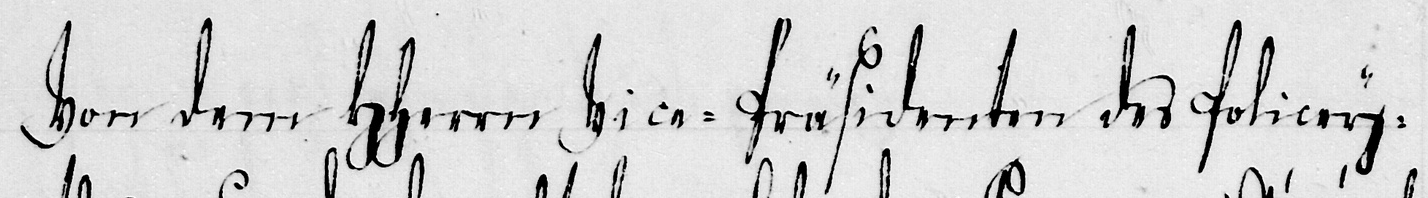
Von dem HHerrn Vice-Präsidenten des Policey¬
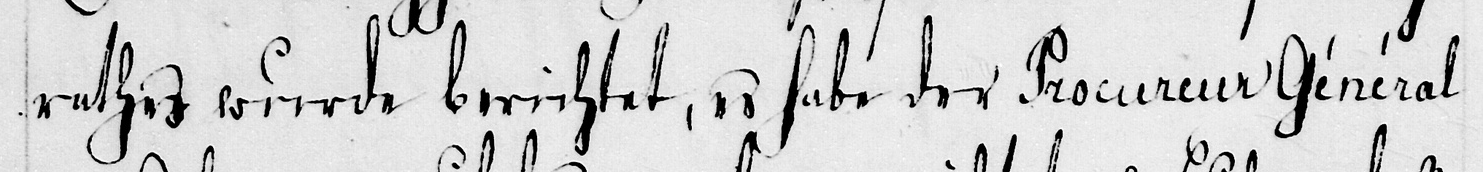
rathes wurde berichtet, es habe der Procureur Général
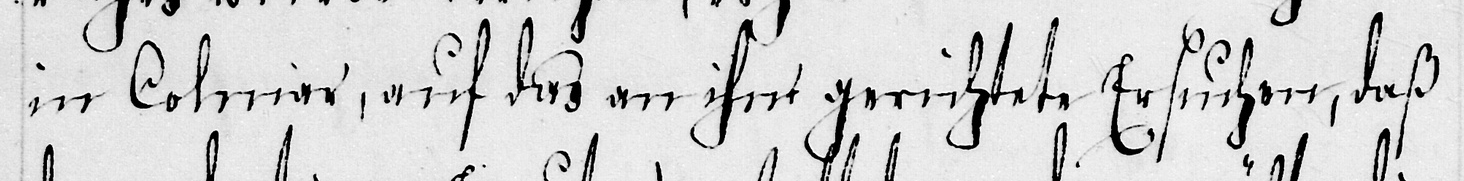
in Colmar, auf das an ihn gerichtete Ersuchen, daß
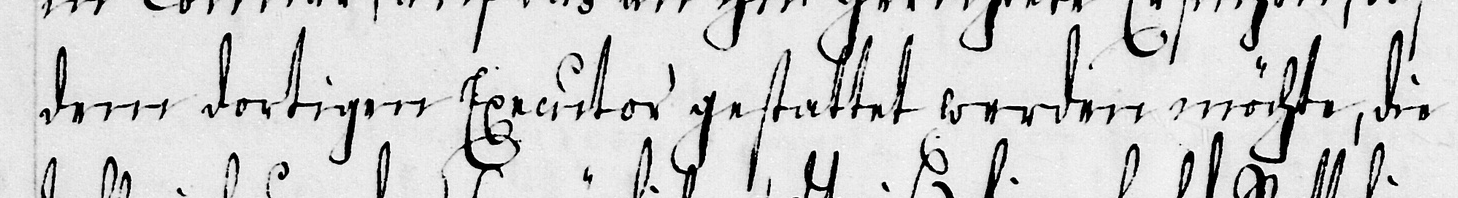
dem dortigen Executor gestattet werden möchte, die
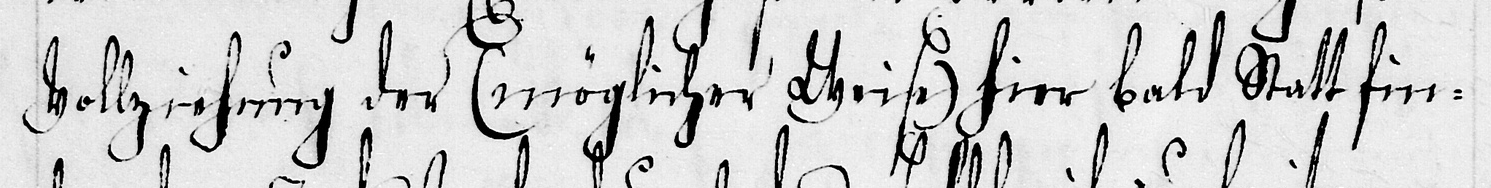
Vollziehung der (möglicher Weise) hier bald Statt fin¬
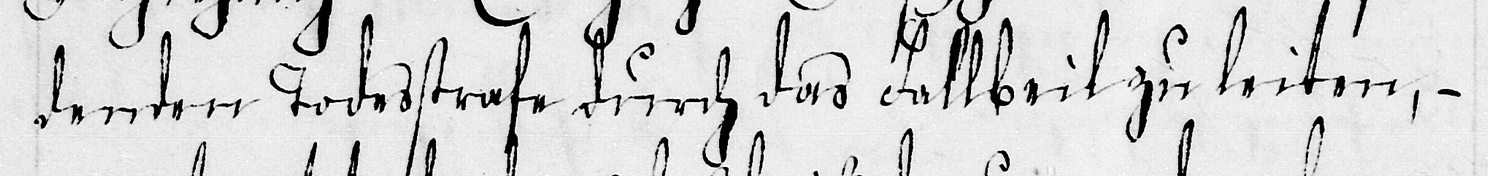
denden Todesstrafe durch das Fallbeil zu leiten,
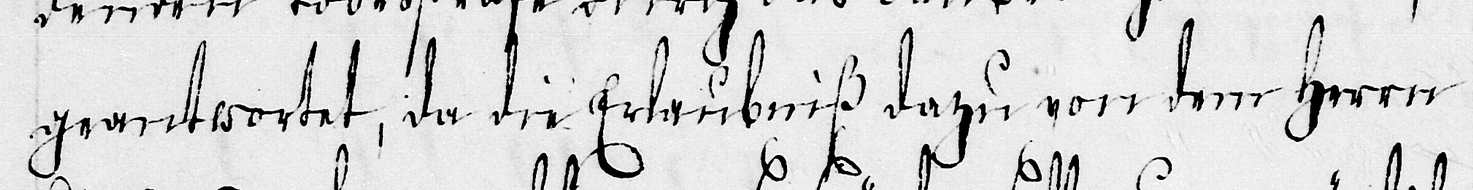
geantwortet, da die Erlaubniß dazu von dem Herrn
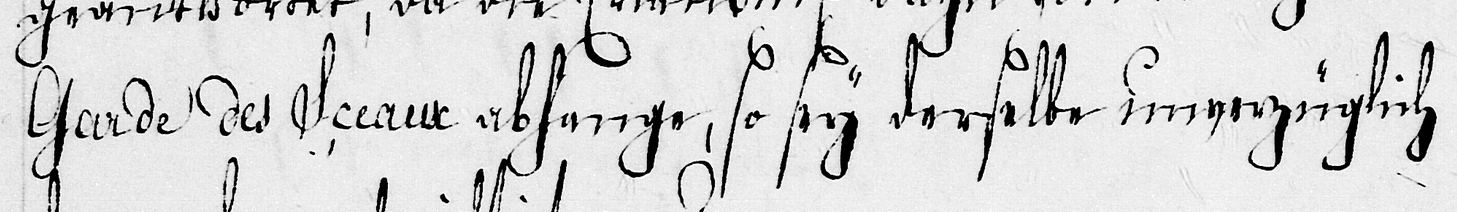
Garde des Sceaux abhange, so sey derselbe unverzüglich
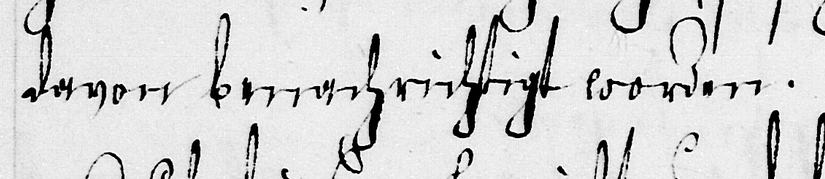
davon benachrichtigt worden.
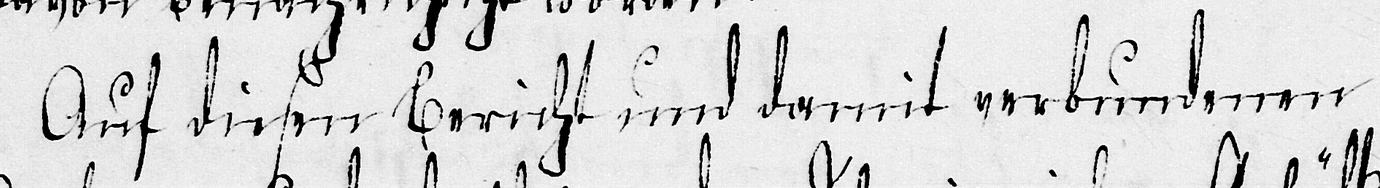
Auf diesen Bericht und damit verbundenen
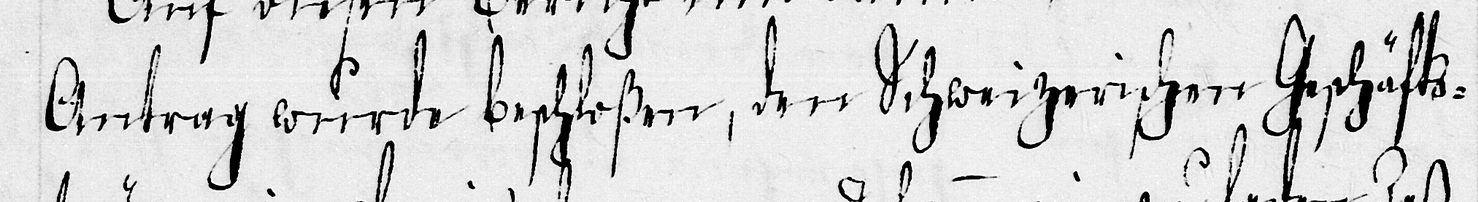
Antrag wurde beschloßen, den Schweizerischen Geschäft¬
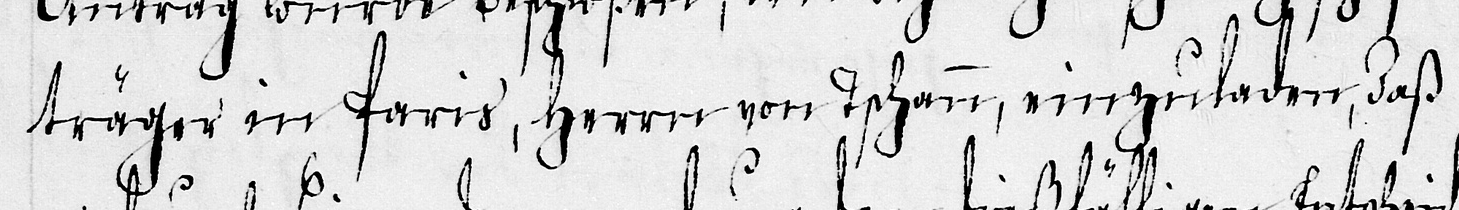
sträger in Paris, Herrn von Tschann, einzuladen, daß
